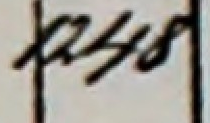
1248
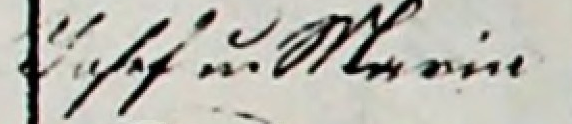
Josef u. Maria
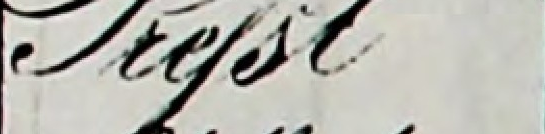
Pressl
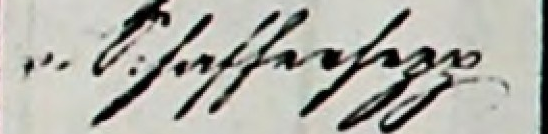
v. Schaffersepp
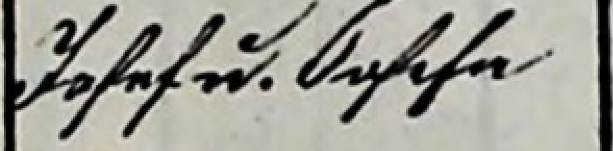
Josef u. Josefa
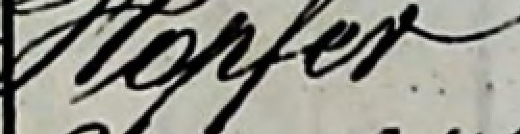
Hopfer
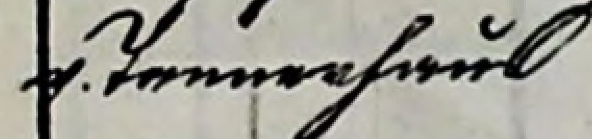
v. Tannenhaus
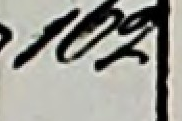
162
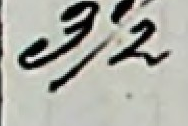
3 1/2
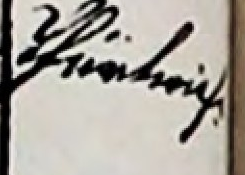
Thür???
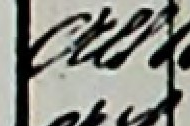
Alt
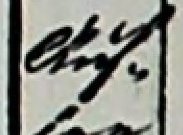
Aus„
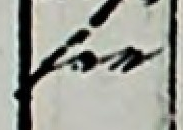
see
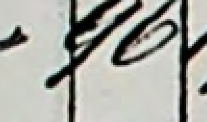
96
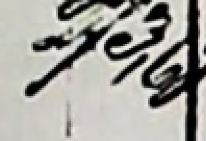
273,60
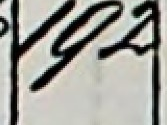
192
